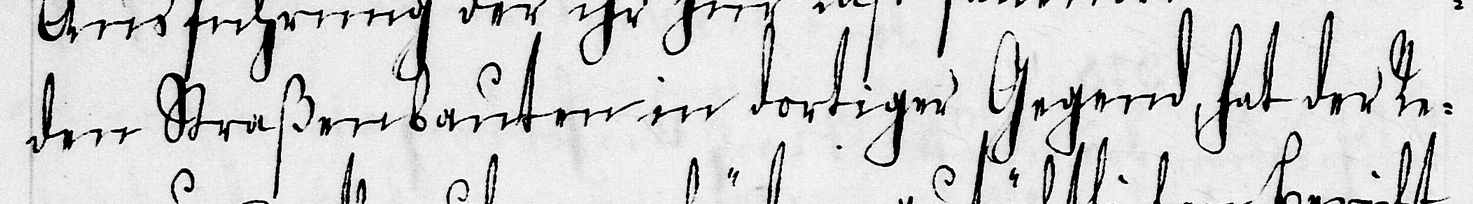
den Straßenbauten in dortiger Gegend, hat der Re¬
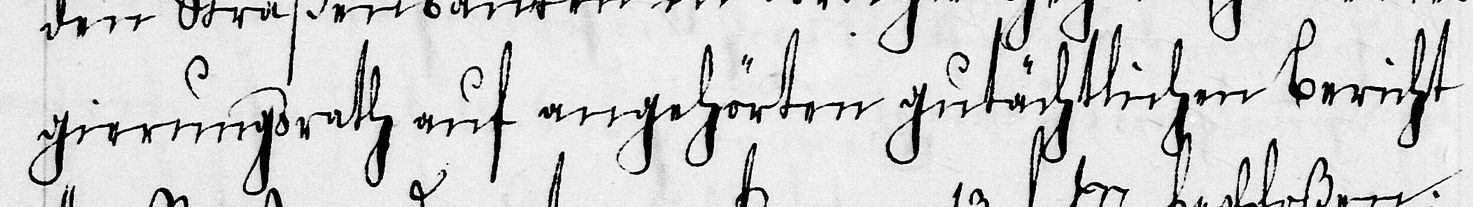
gierungsrath auf angehörten gutächtlichen Bericht
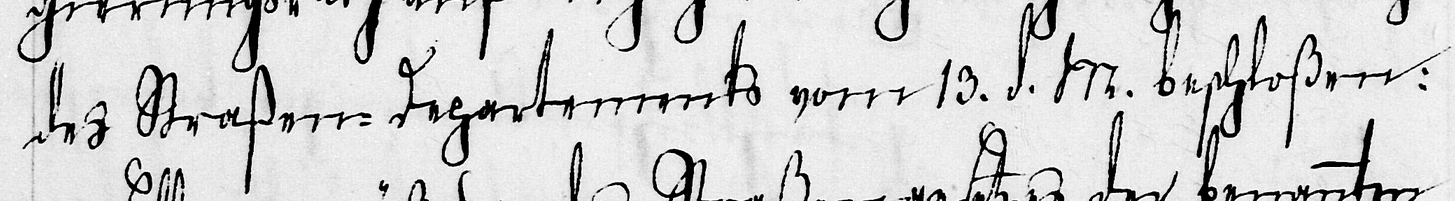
des Straßen-Departements vom 13. d. M. beschloßen:
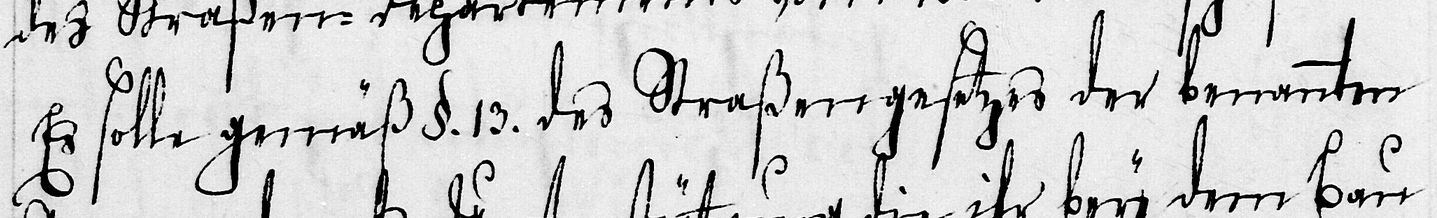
Es solle gemäß §. 13. des Straßengesetzes der benannten
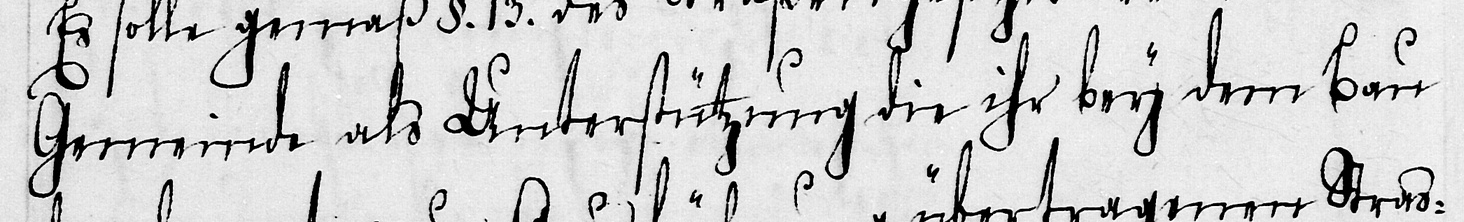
Gemeinde als Unterstützung die ihr bey dem Bau
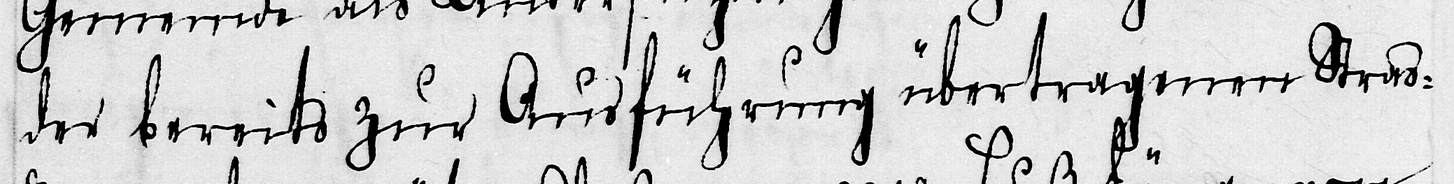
der bereits zur Ausführung übertragenen Straß¬
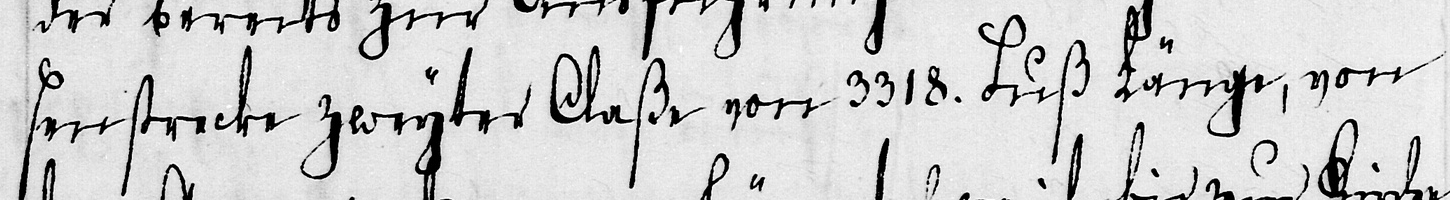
enstrecke zweyter Claße von 3318. Fuß Länge, von
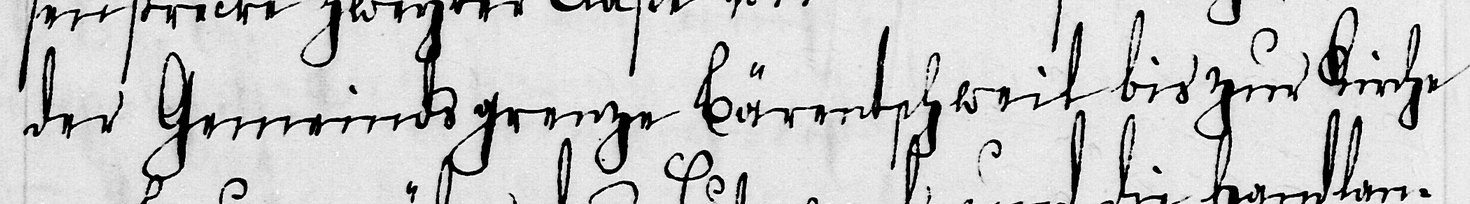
der Gemeindsgrenze Bärentschweil bis zur Kirche
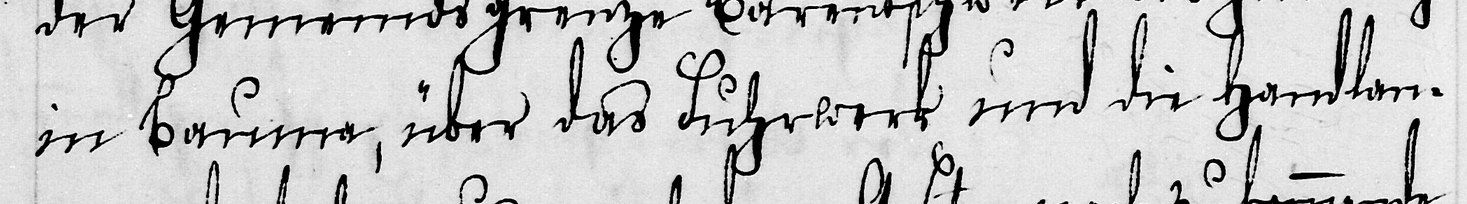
in Bauma, über das Fuhrwerk und die Handlan¬
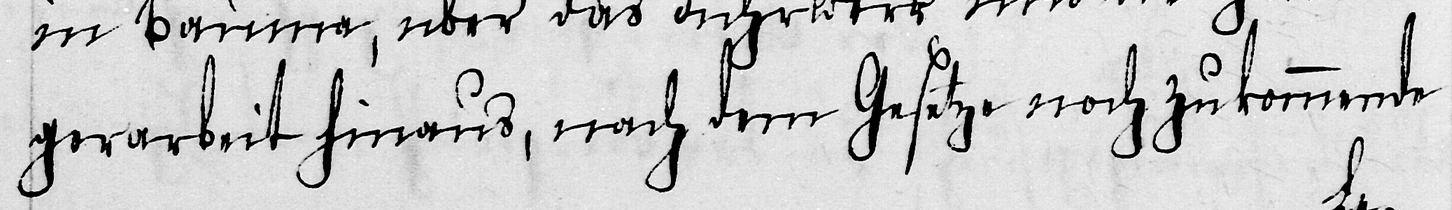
gerarbeit hinaus, nach dem Gesetze noch zukommende
